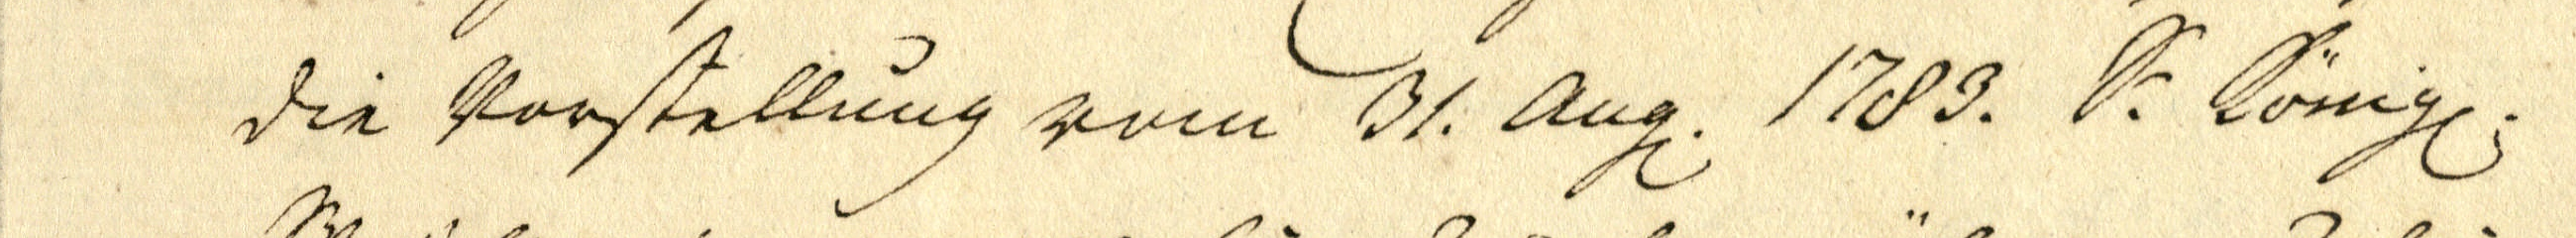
die Vorstellung vom 31. Aug. 1783. Sr. Königl.
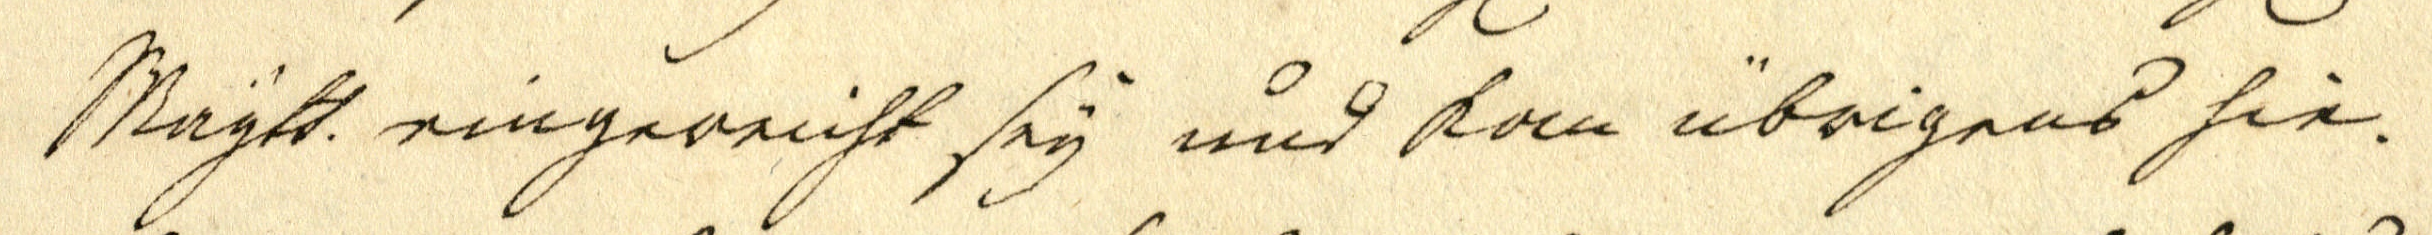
Maÿtt. eingereicht seÿ und kan übrigens hie¬
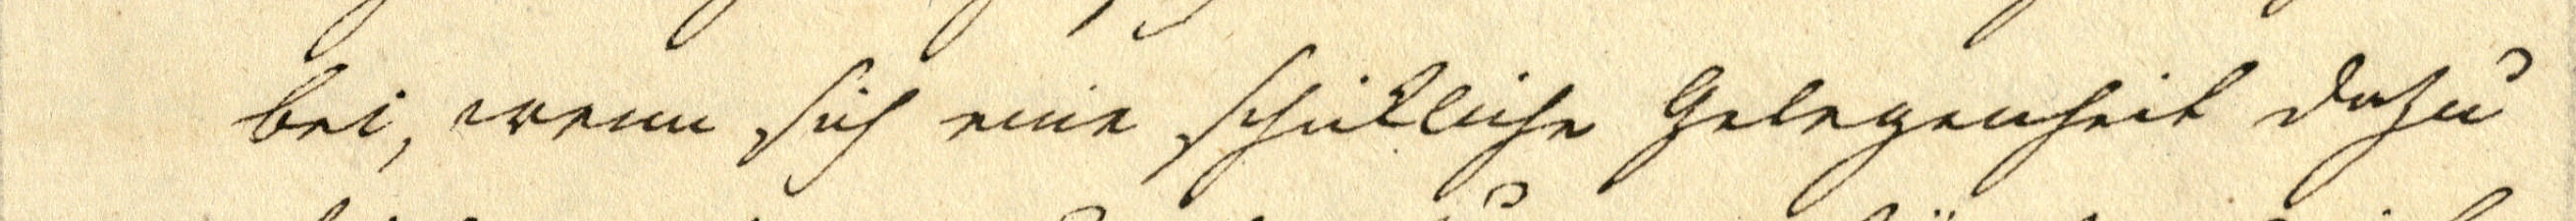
bei, wenn sich eine schickliche Gelegenheit bdazu
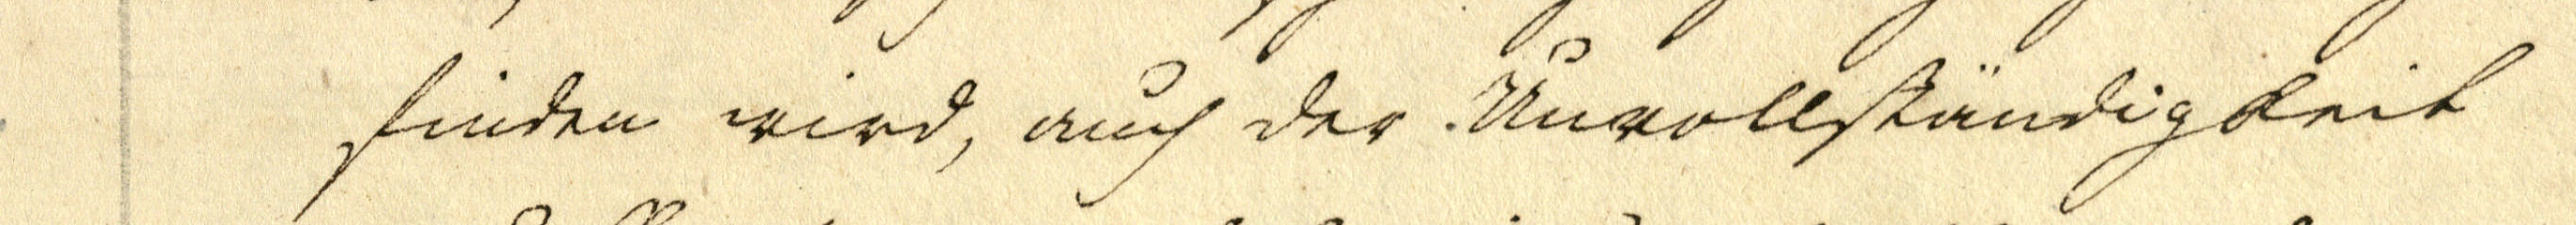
finden wird, auch der Unvollständigkeit
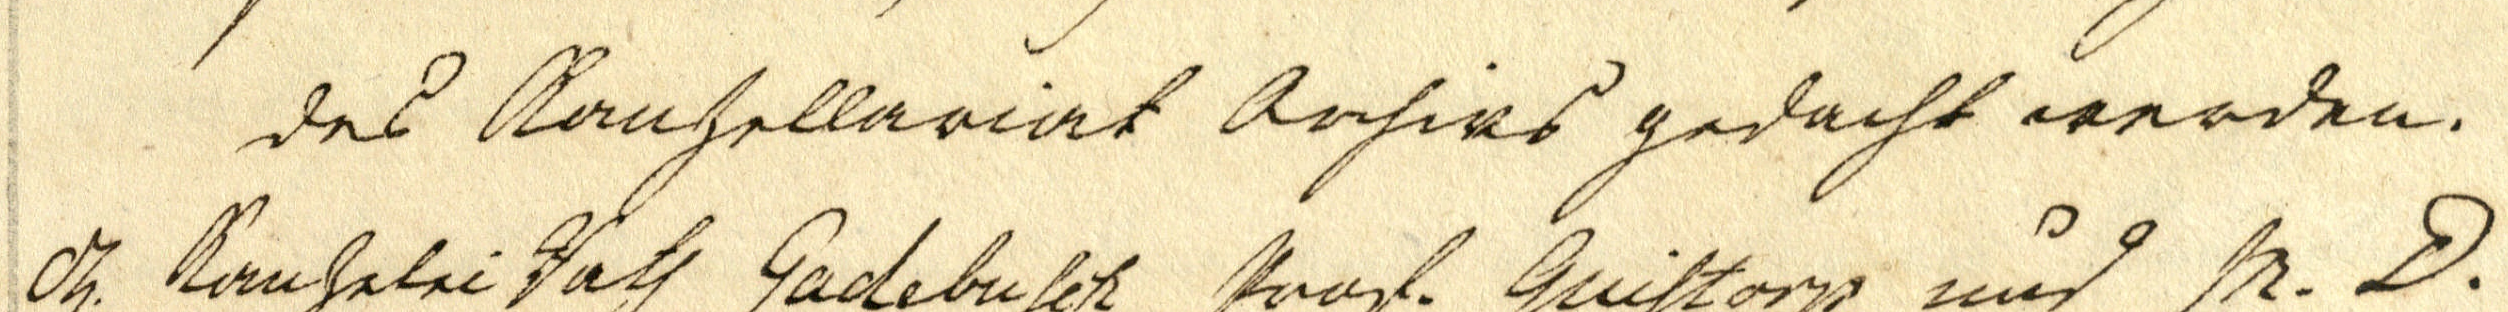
des Kanzellarit Archivs gedacht werden.
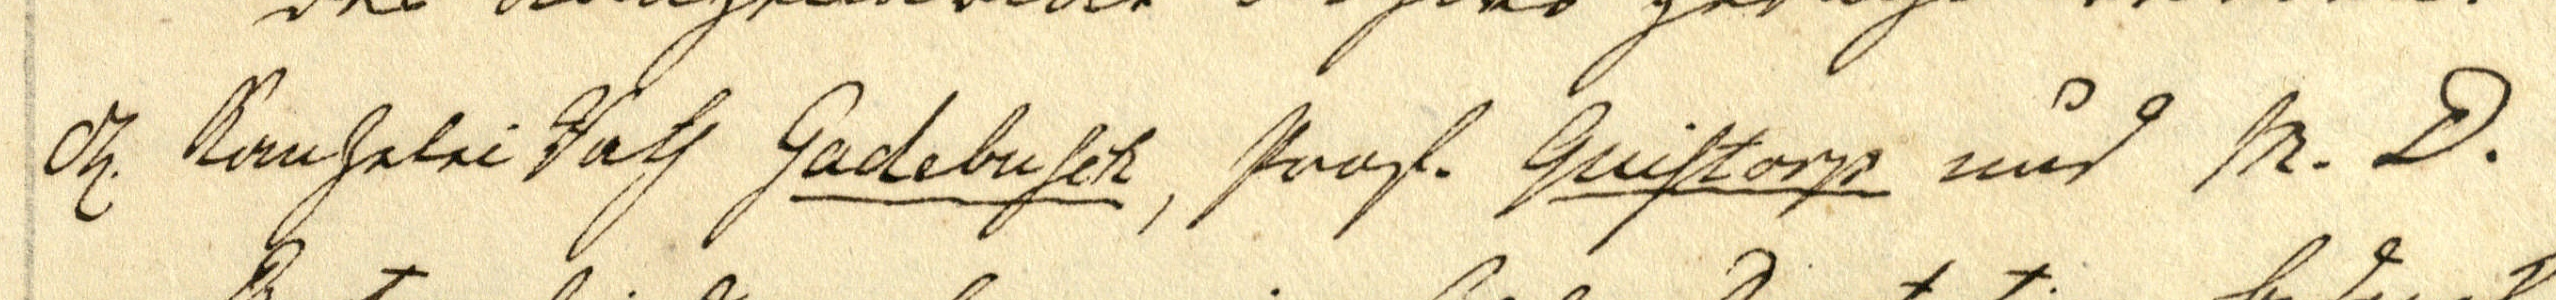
dh. Kanzelei Rath Gadebusch, Prof. Quistorp und M. D.
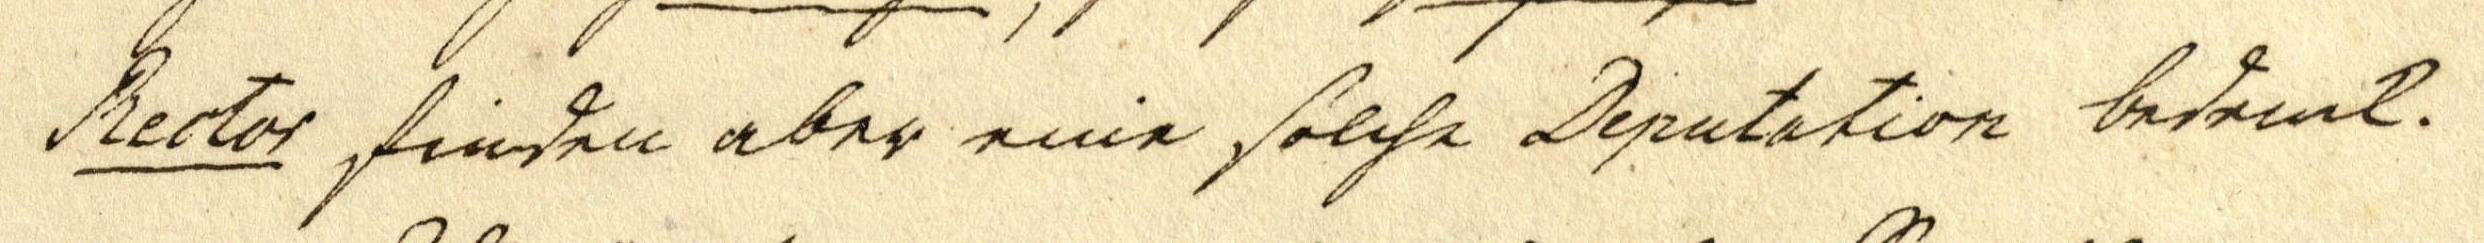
Rector finden aber eine solche Deputation bedenck¬
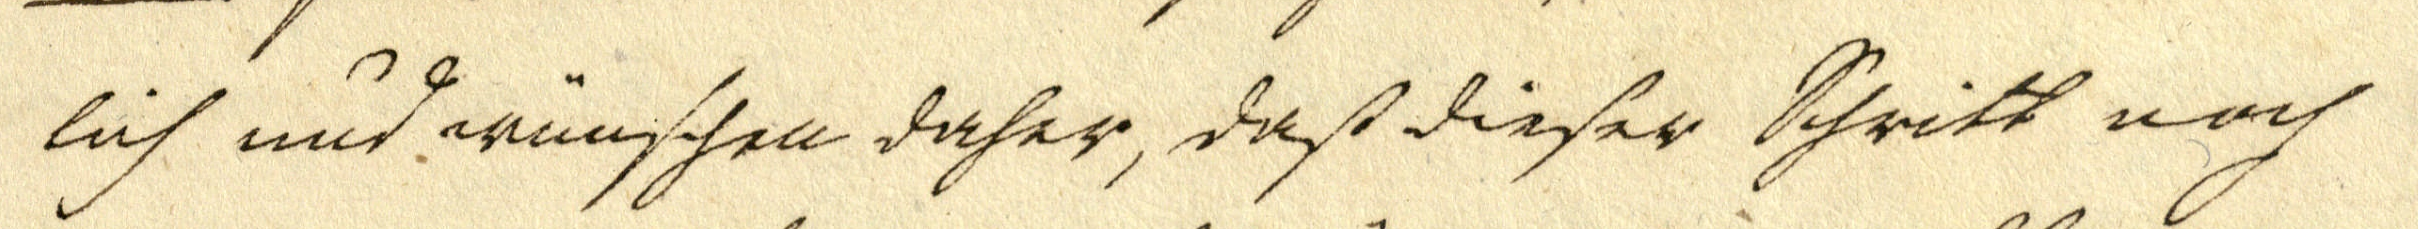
lich und wünschen daher, daß dieser Schritt noch
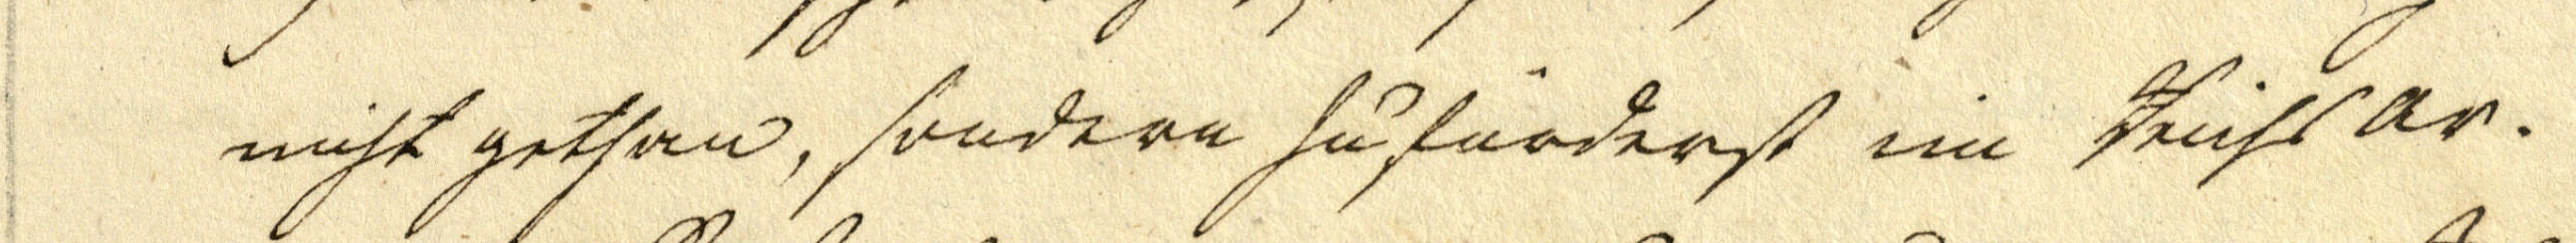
nicht gethan, sondern zuförderst im Reichsar¬
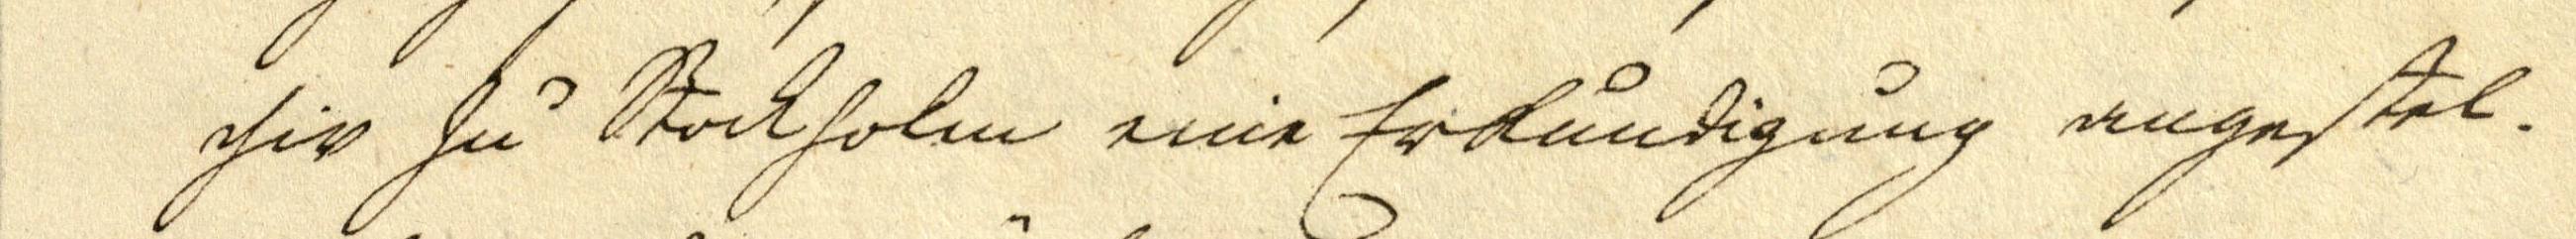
chiv zu Stockholm eine Erkundigung angestel¬
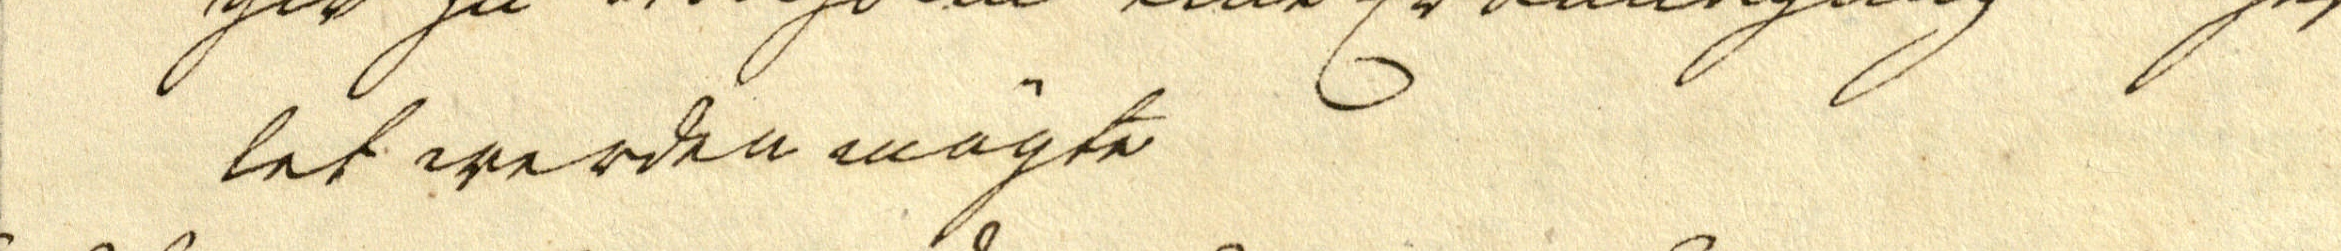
let werden mögte.
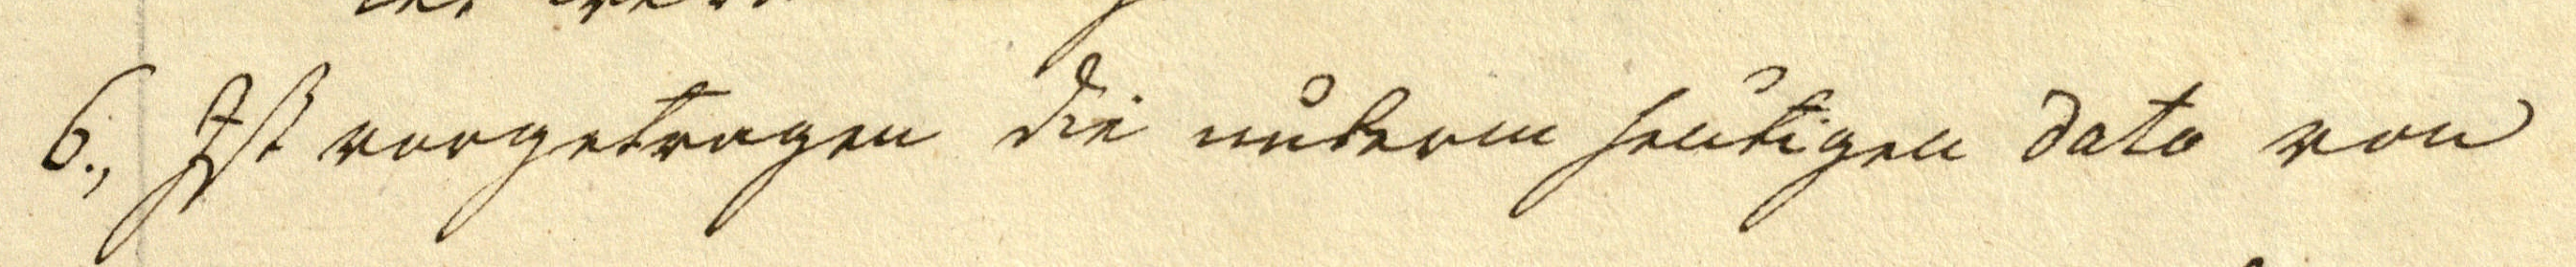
6., Ist vorgetragen die unterm heutigen dato von
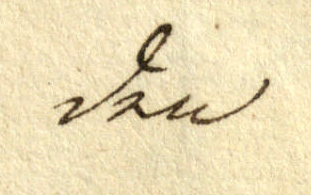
den
